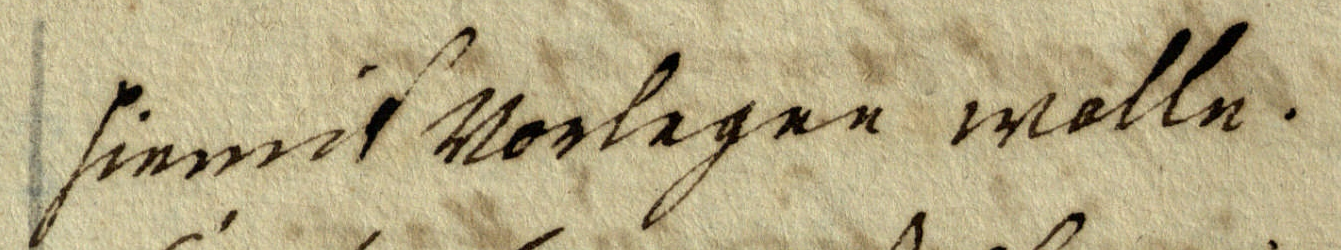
hiemit vorlegen wolle.
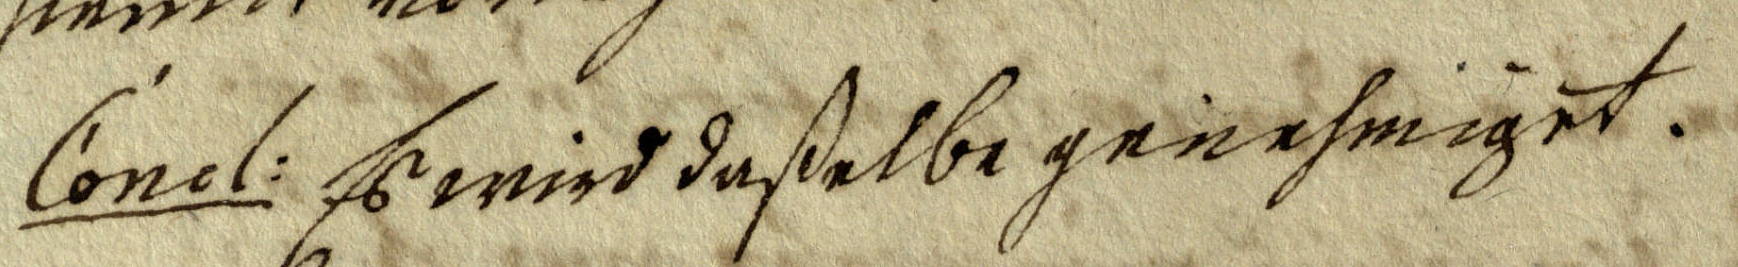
Concl. Es wird daßelbe genhmiget.
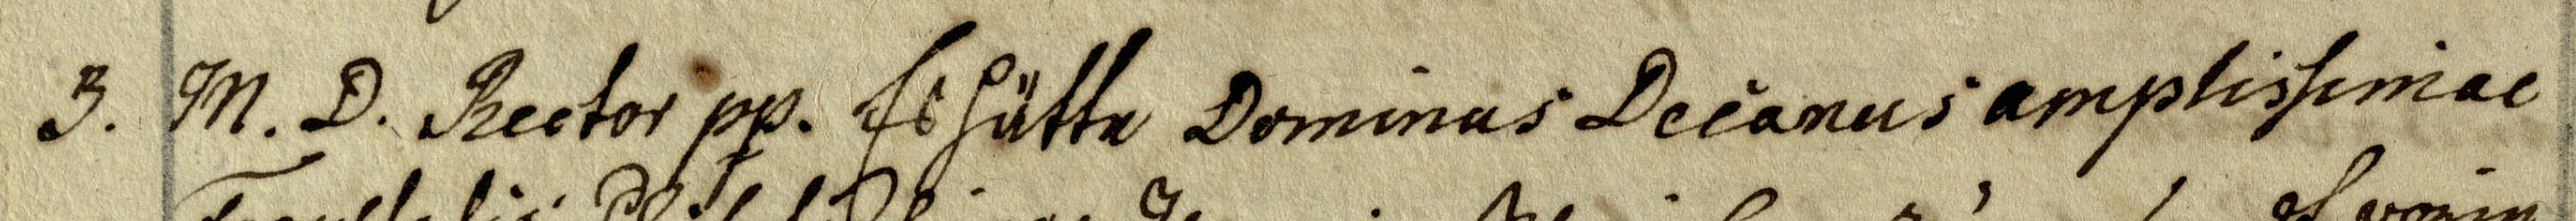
3. M. D. Rector pp. Es hätte Dominus Decanus amplissimae
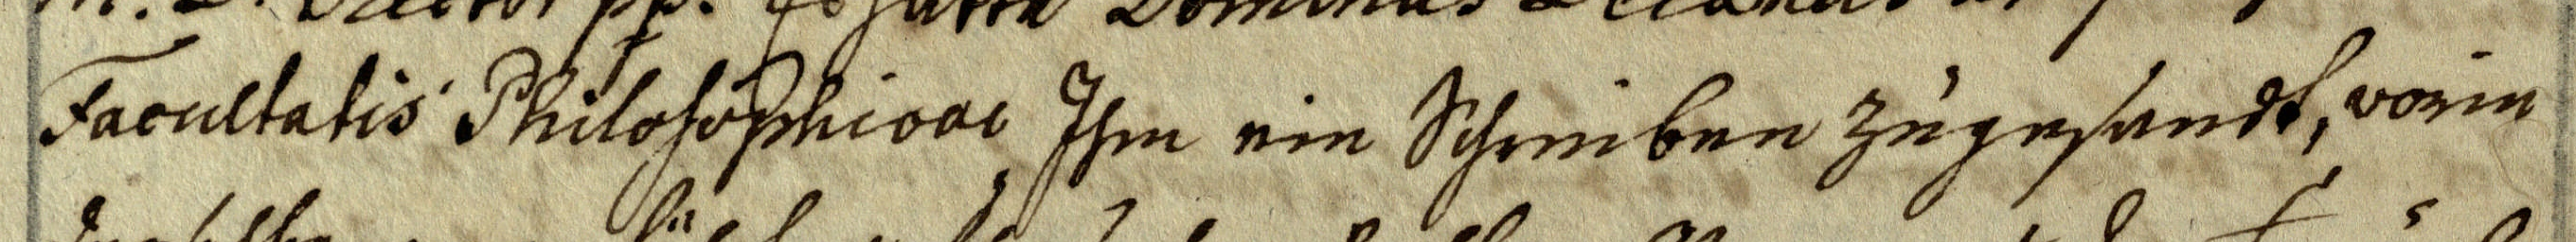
Facultatis Philosophicae Ihm ein Schreiben zugesandt, worin
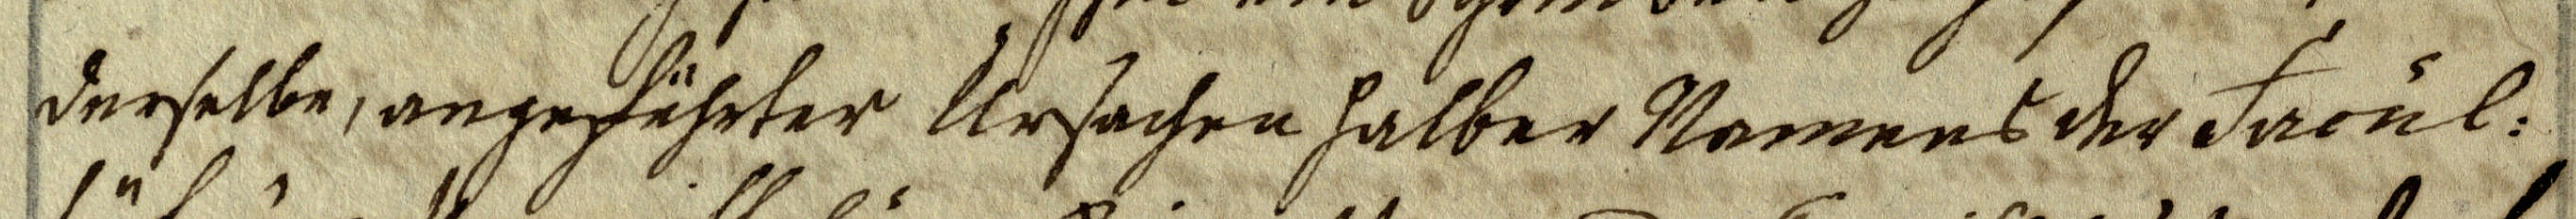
derselbe, angeführter Ursachen halber Namens der Facul¬
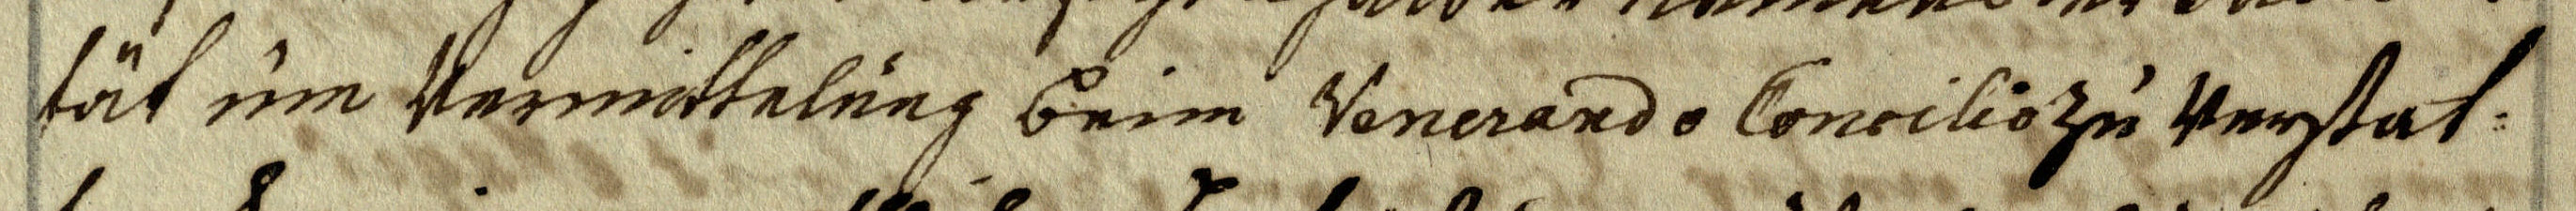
tät um Vermittelung beim Venerando Concilio zu verstat¬
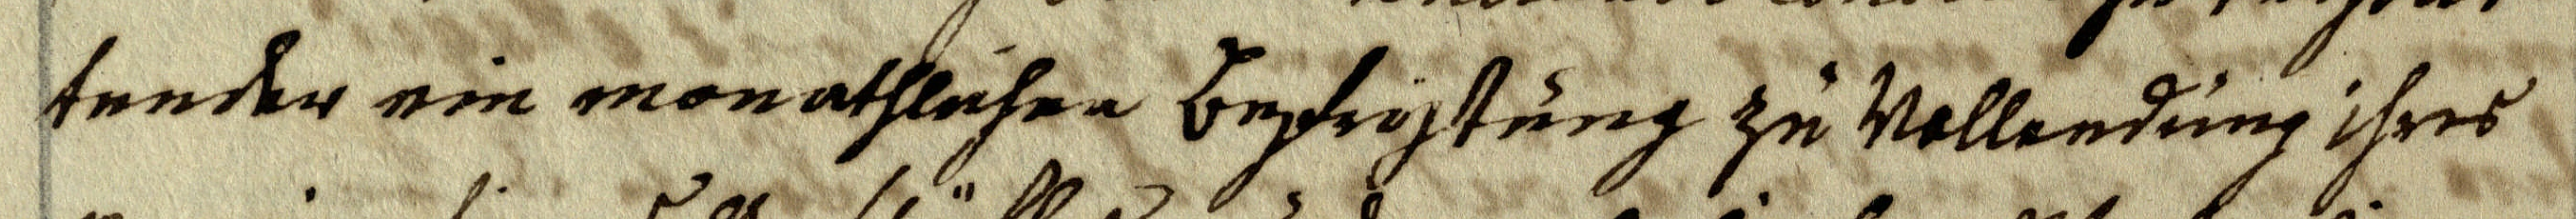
tender ein monathlicher Befristung zu Vollendung ihres
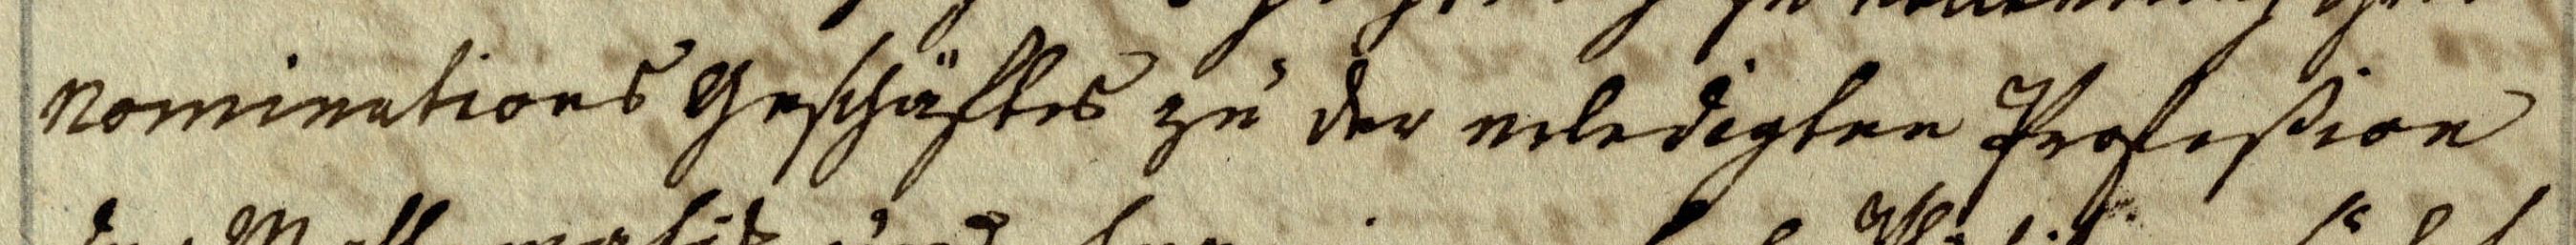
Nominations Geschäftes zu der erledigten Profeßion
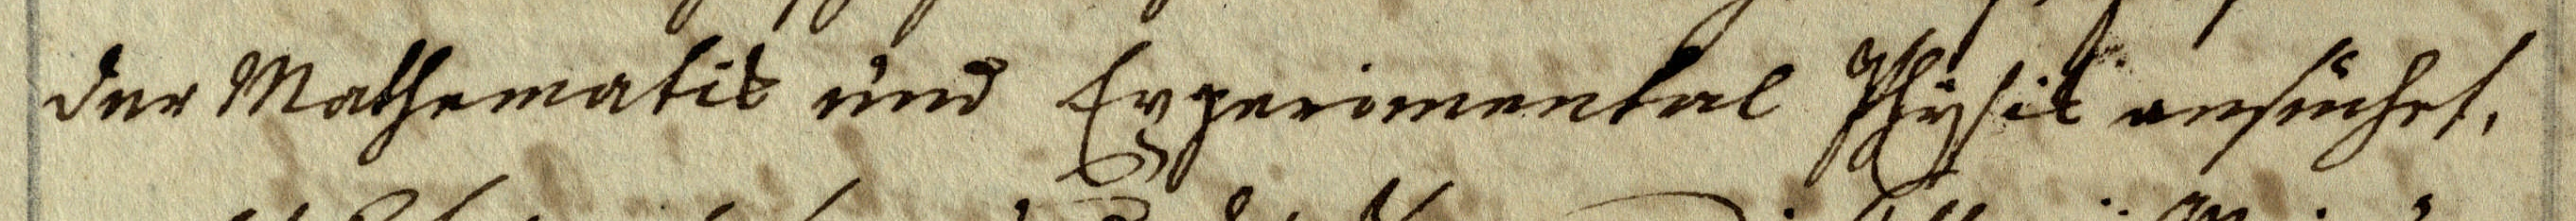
der Mathematik und Experimental Phÿsik ansuchet,
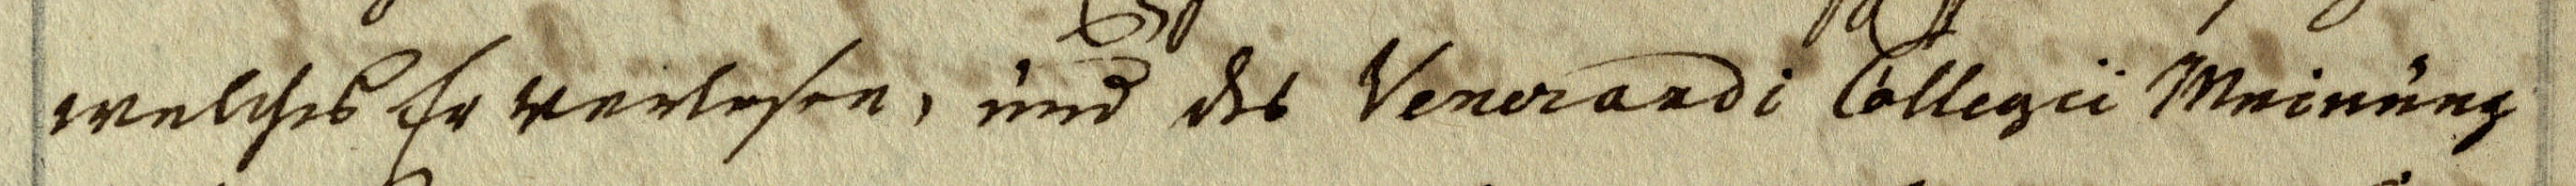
welches Er verlesen, und des Venerandi Collegii Meinung
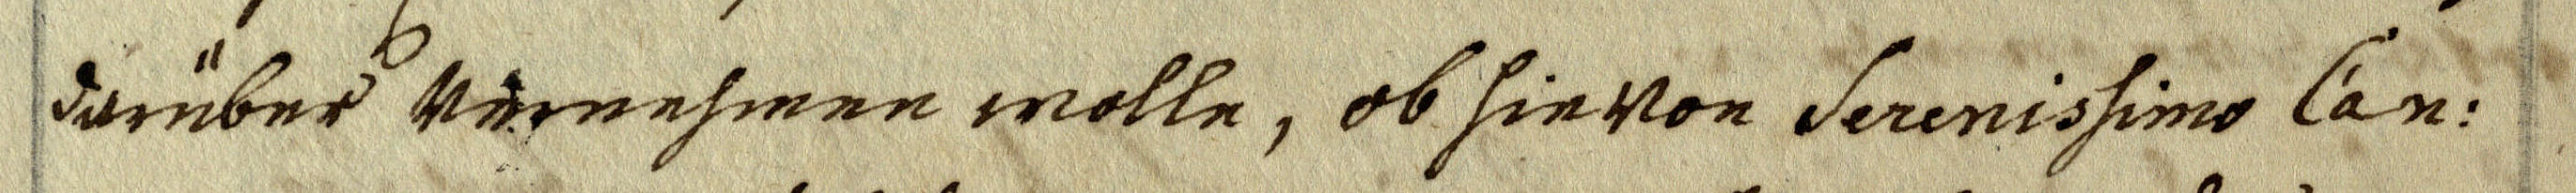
darüber vernehmen wolle, ob hievon Serenissimo Can¬
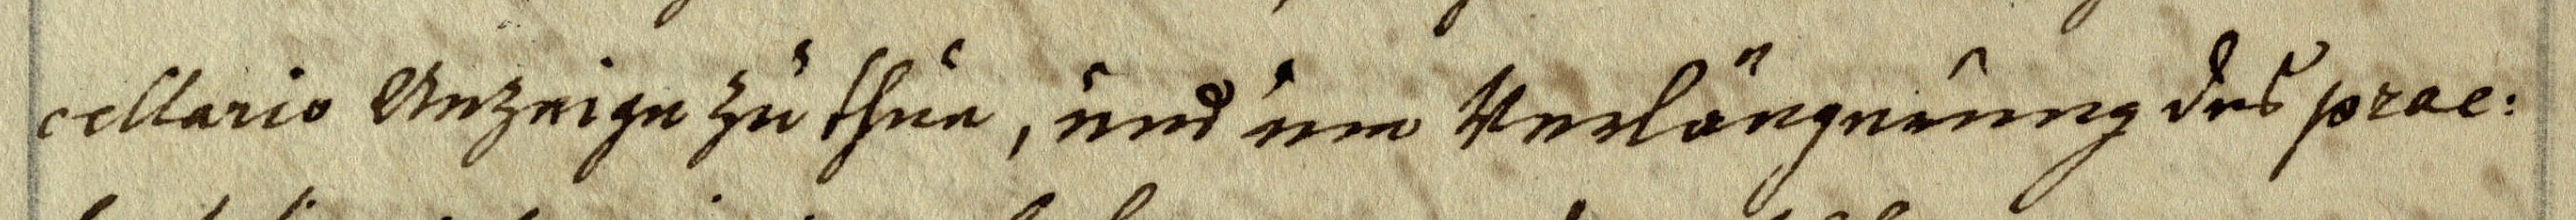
cellario Anzeige zu thun, und um Verlängerung des prae¬
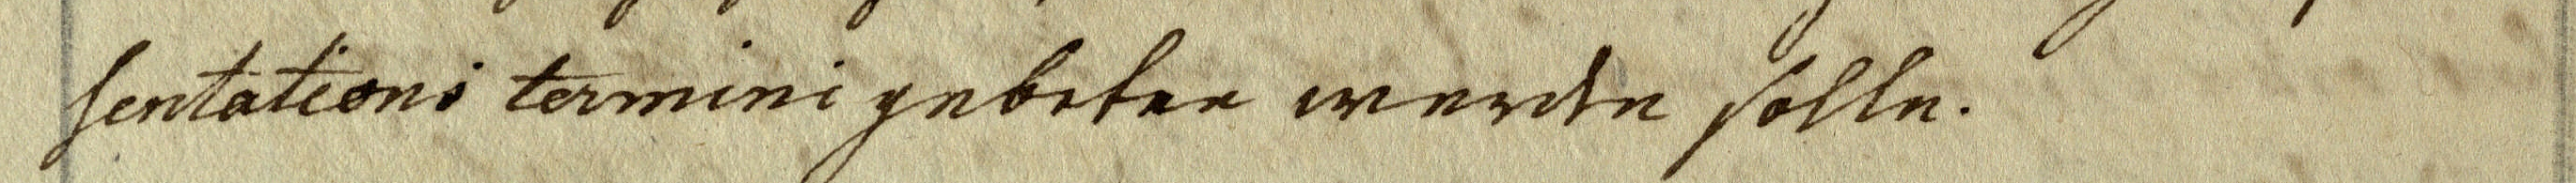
sentations termini gebeten werden solle.
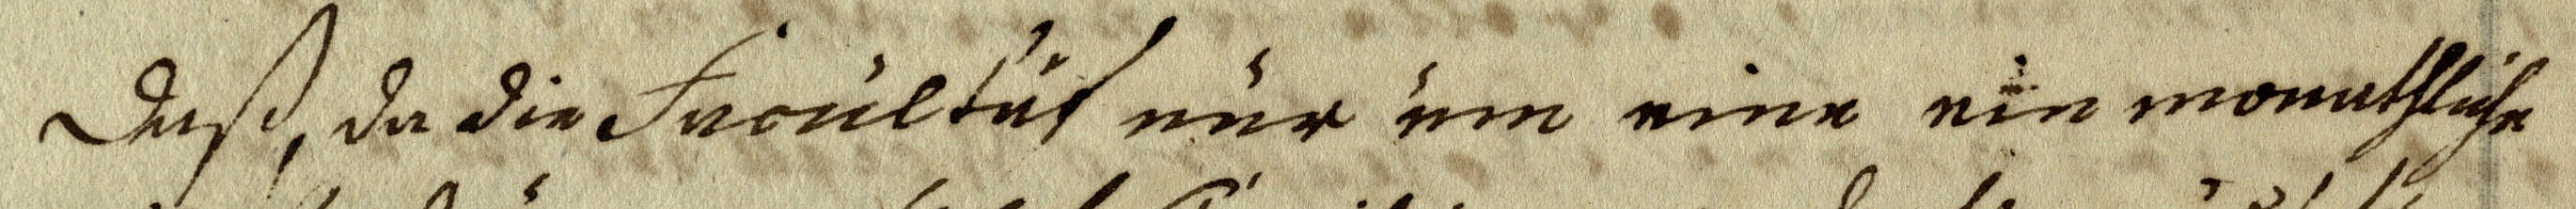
Daß, da die Facultät nur um eine ein monatliche
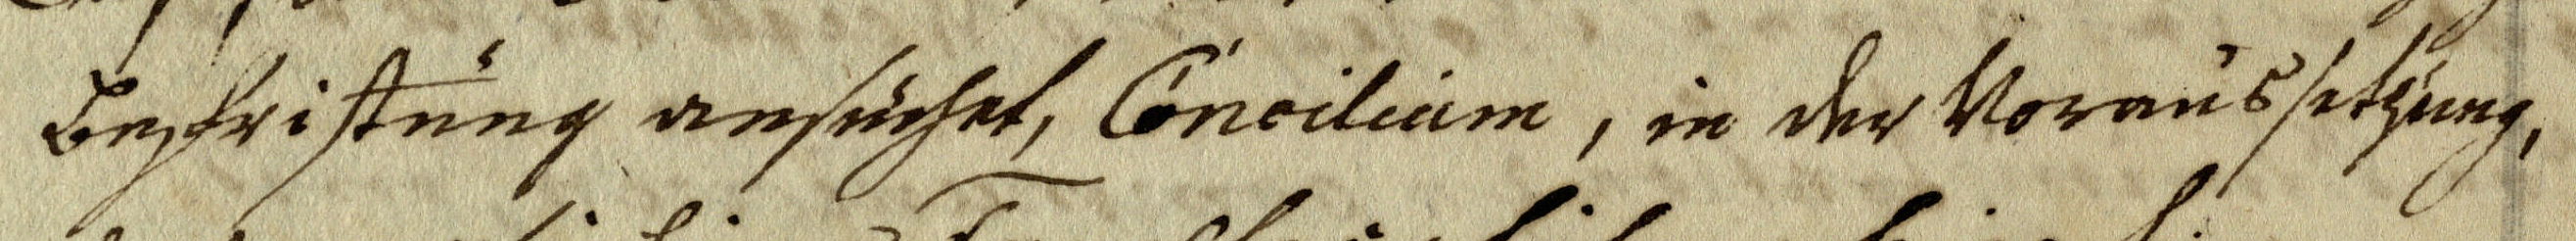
Befristung ansuchet, Concilium, in der Voraussetzung,
